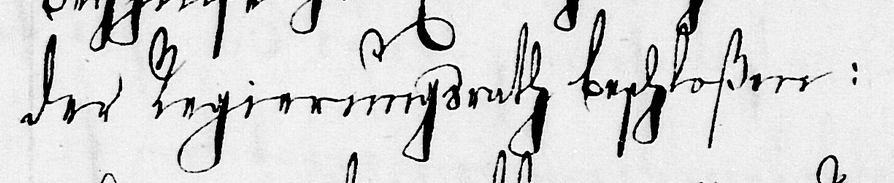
der Regierungsrath beschloßen:
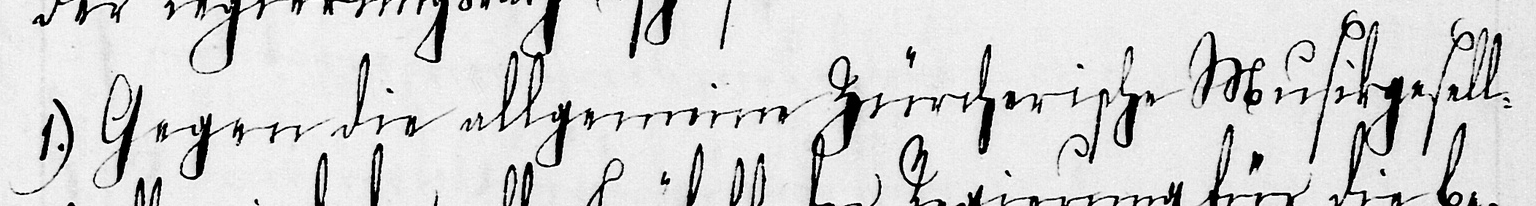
1.) Gegen die allgemeine Zürcherische Musikgesell¬
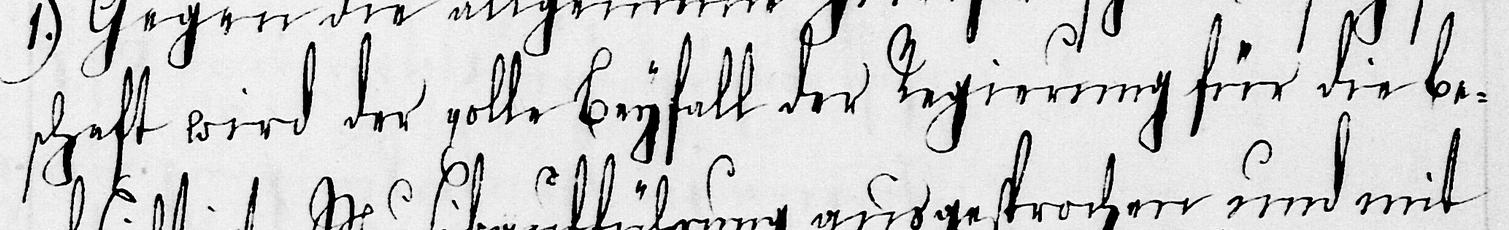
schaft wird der volle Beyfall der Regierung für die be¬
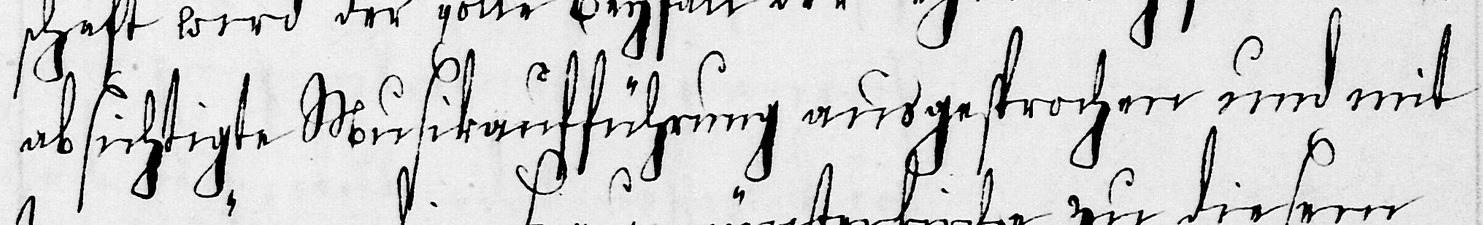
absichtigte Musikaufführung ausgesprochen und mit
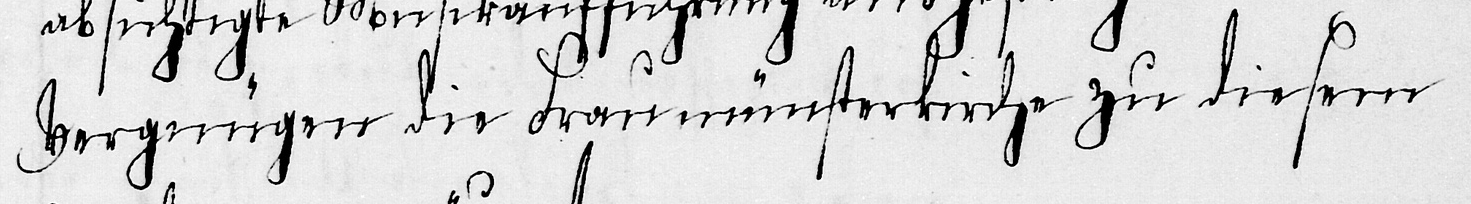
Vergnügen die Fraumünsterkirche zu diesem
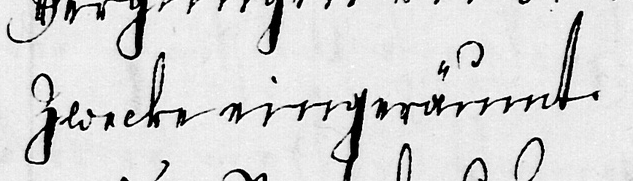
Zwecke eingeräumt.
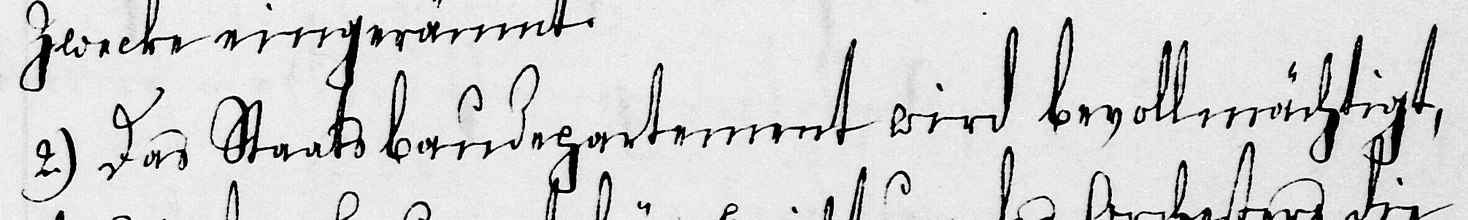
2.) Das Staatsbaudepartement wird bevollmächtigt,
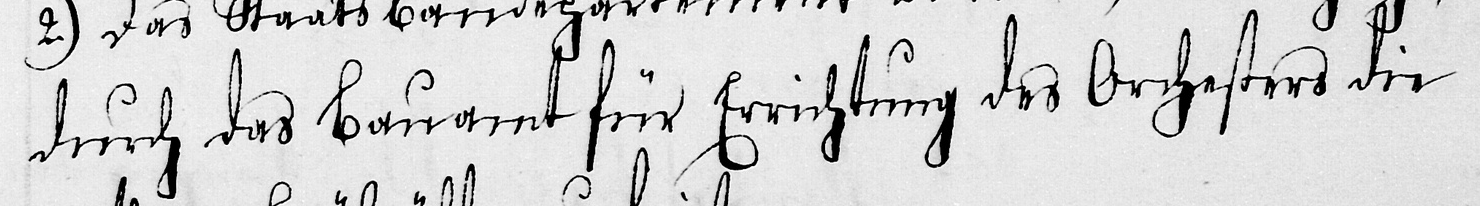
durch das Bauamt für Errichtung des Orchesters die
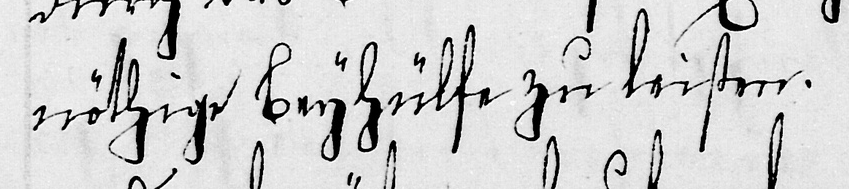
nöthige Beyhülfe zu leisten.
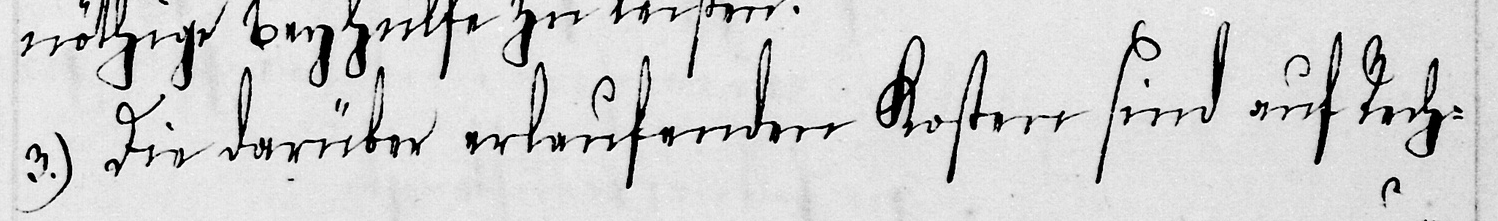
3.) Die darüber verlaufenden Kosten sind auf Rech-
